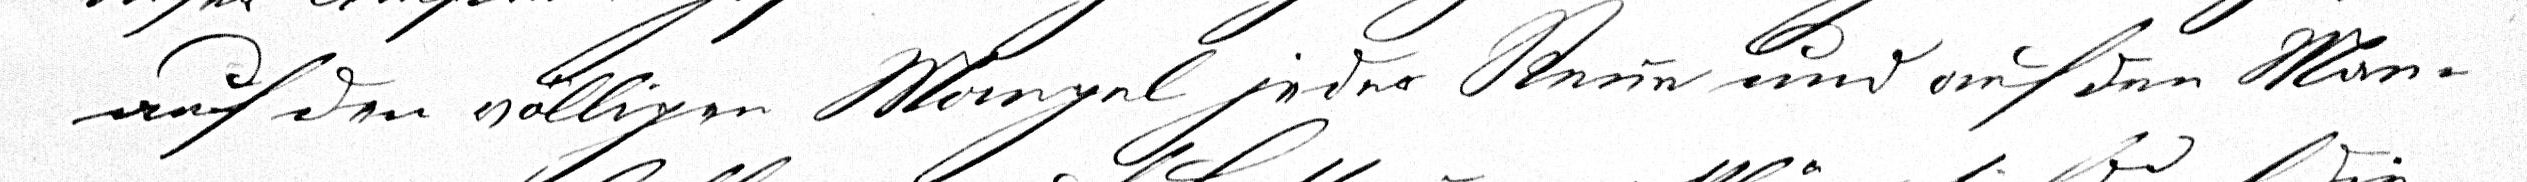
auf den völligen Mangel jeder Reue und auf den Man¬
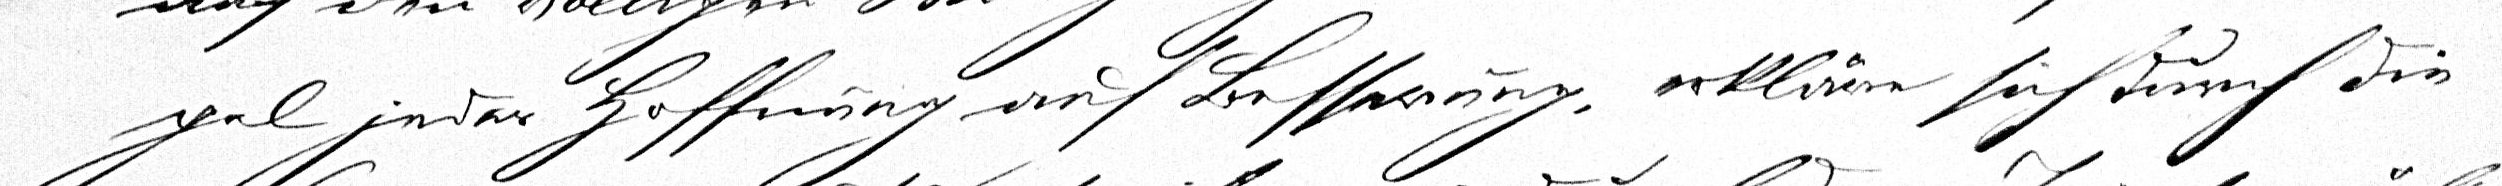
gel jeder Hoffnung auf Besserung, erkläre sich durch die
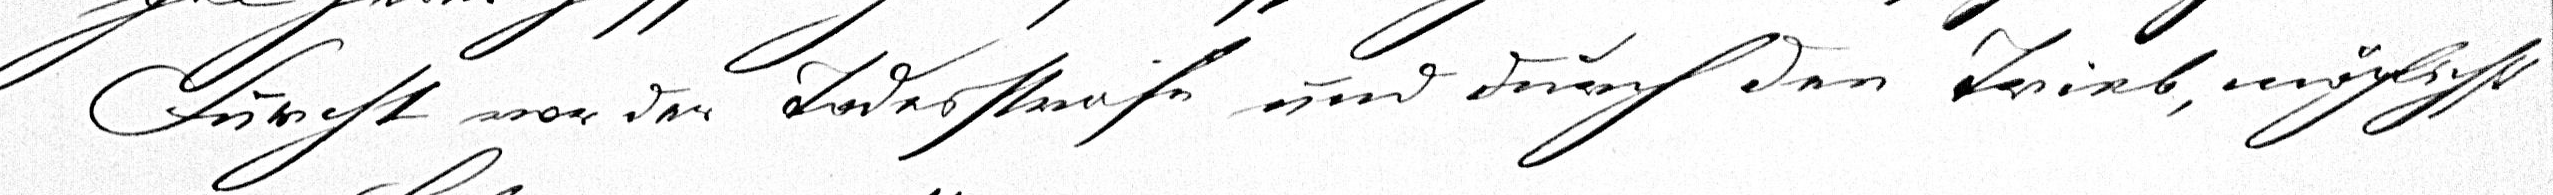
Furcht vor der Todesstrafe und durch den Trieb, möglichst
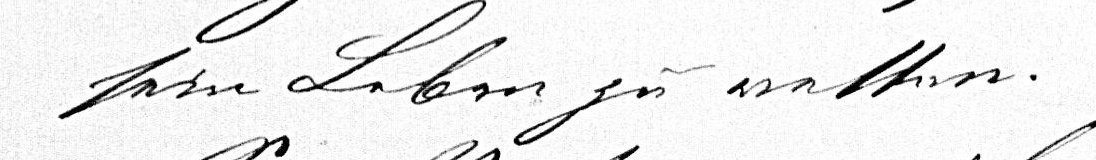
sein Leben zu retten.
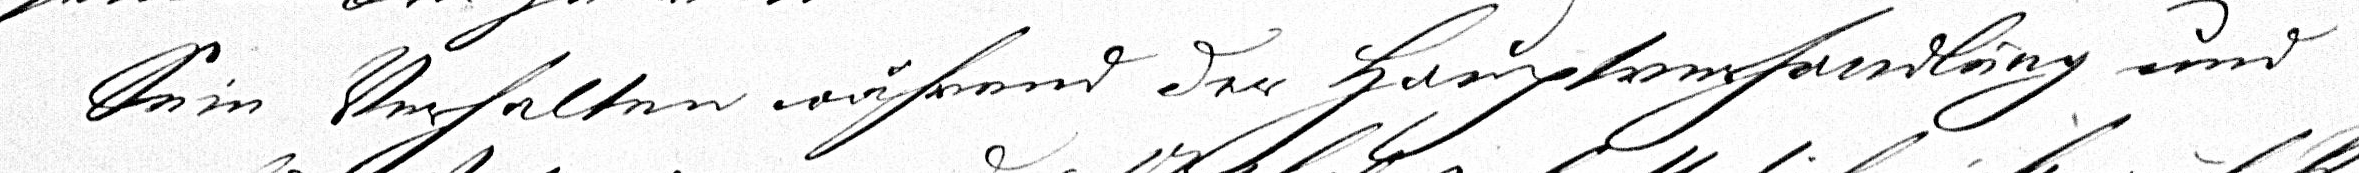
Sein Verhalten während der Hauptverhandlung und
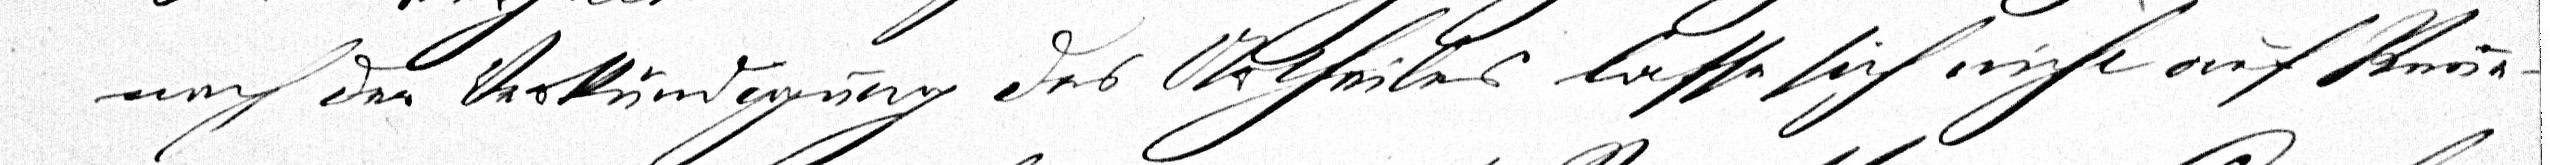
noch der Verkündigung des Urtheiles lasse sich nicht auf Keue¬
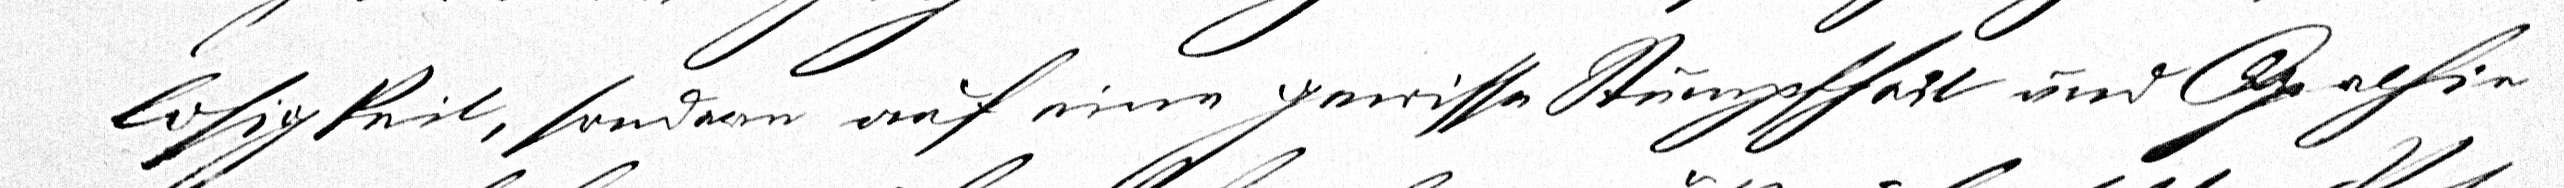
losigkeit, sondern auf eine gewisse Stumpfheit und Apathie
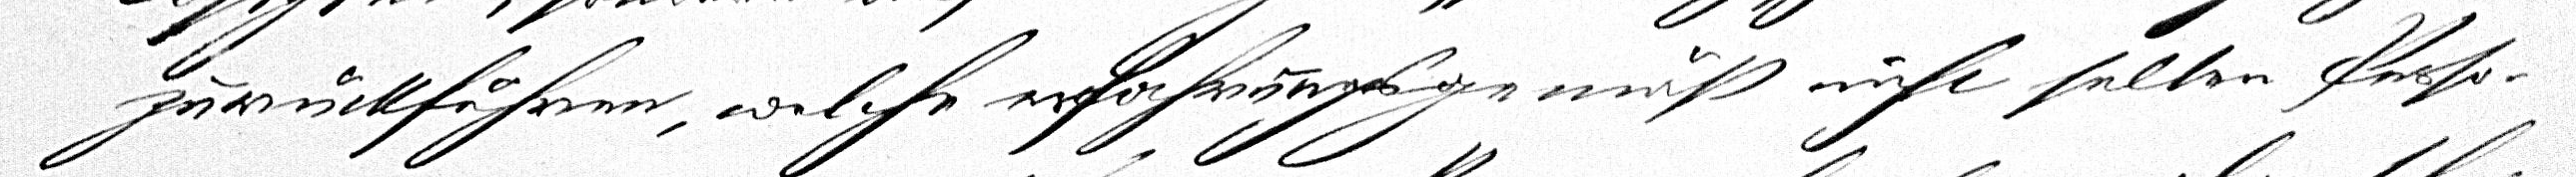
zurückführen, welche erfahrungsgemäß nicht selten Perso¬
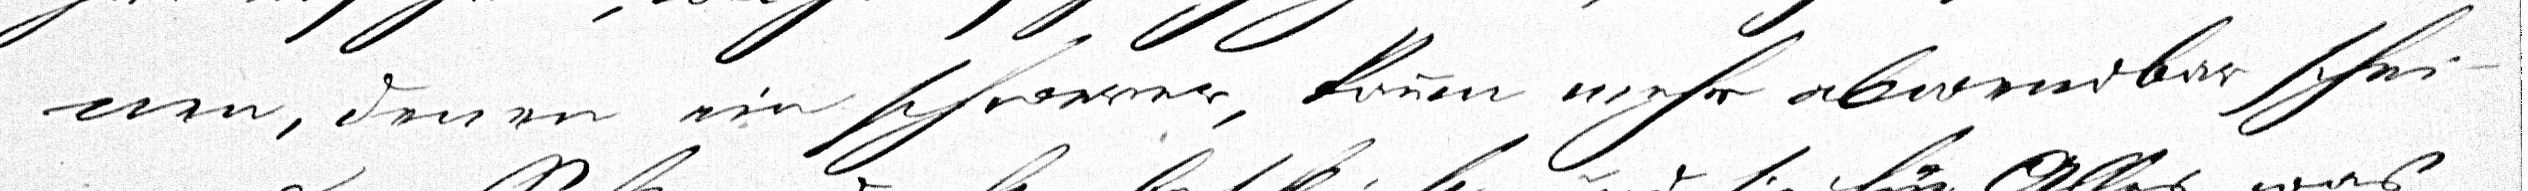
nen, denen ein schwerer, kaum mehr abwendbar schei¬
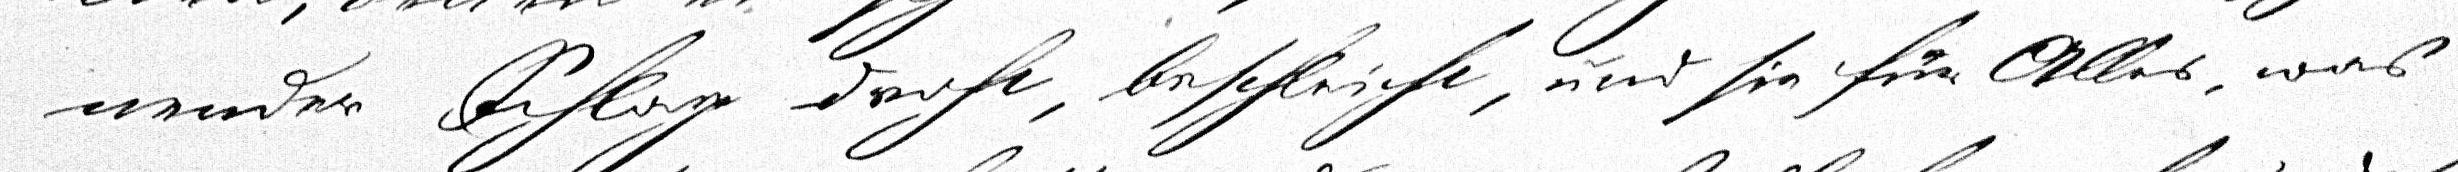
nender Schlag droht, beschleicht, und sie für Altes, was
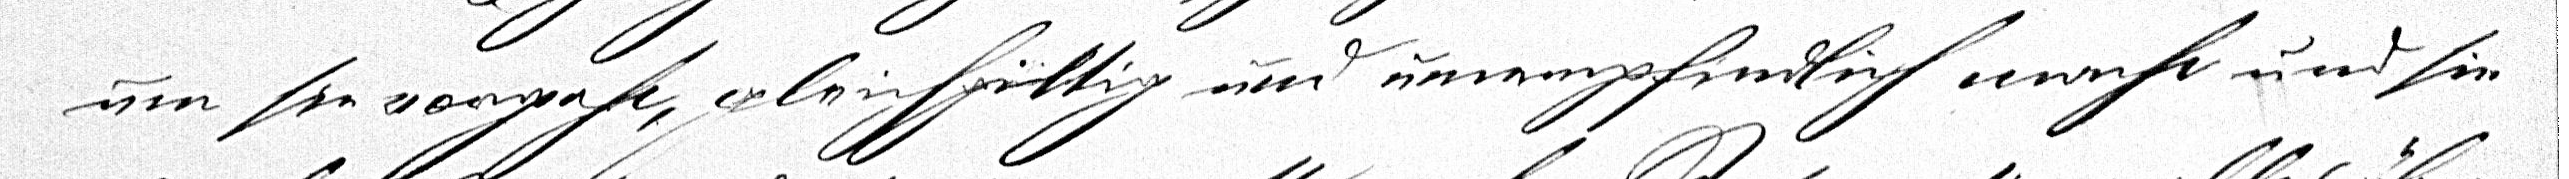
um sie vorgeht, gleichgültig und unempfindlich macht und sie
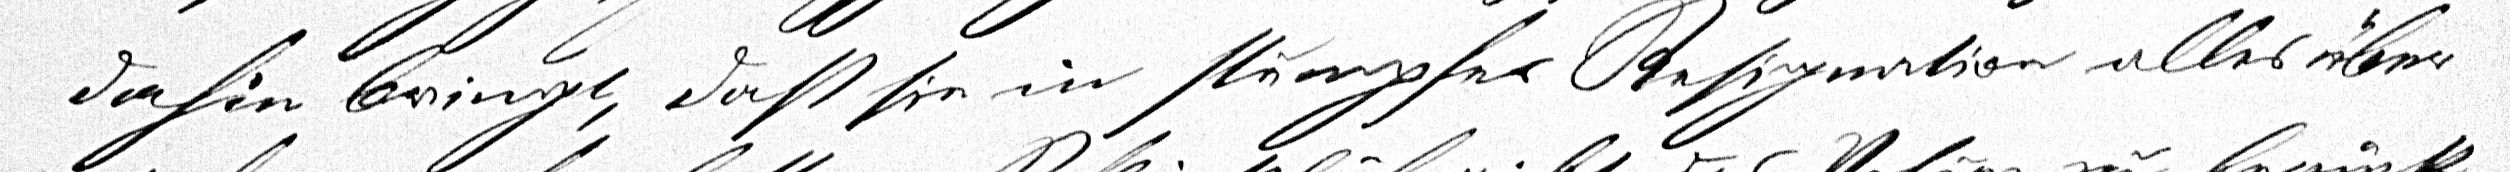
dahin bringt, daß sie in stumpfer Resignation alles über
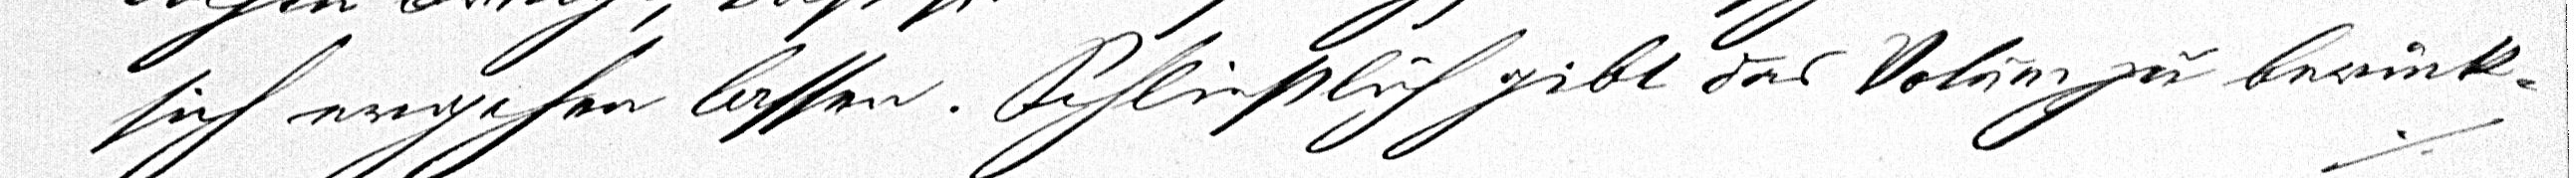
sich ergehen lassen. Schließlich gibt des Volum zu berück
